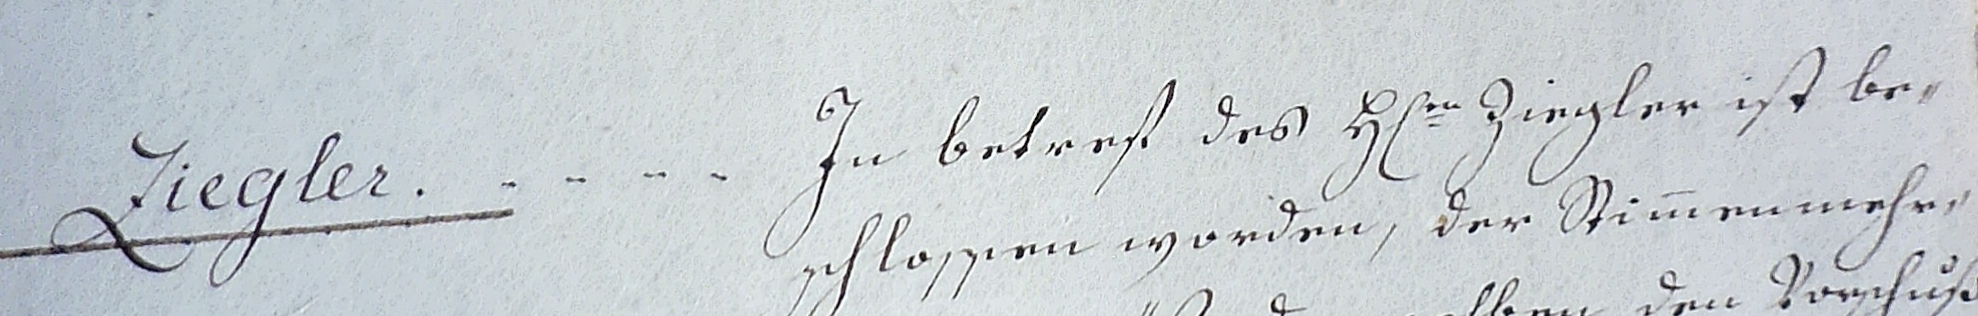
Ziegler. .. .. .. .. In betref des HEr͇n Ziegler ist be¬
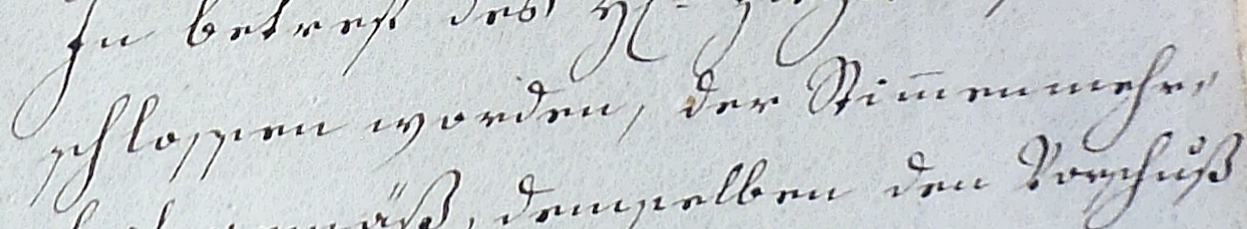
schlossen worden, der Stim̅enmehr¬
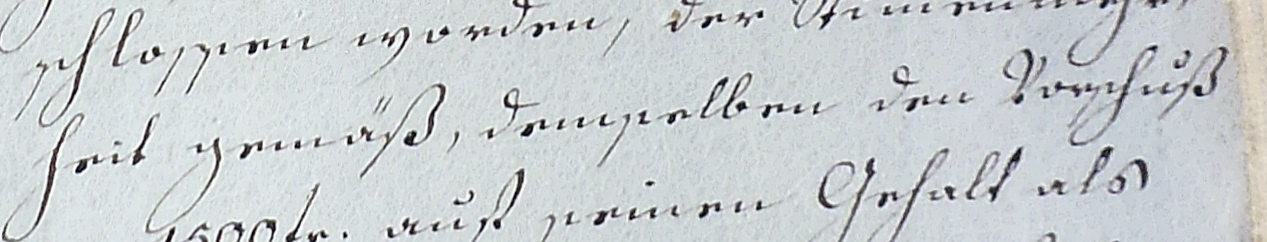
heit gemäß, demselben den Vorschuß
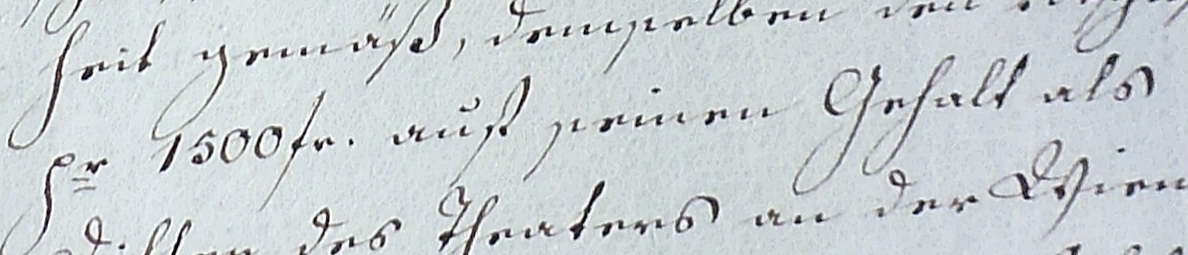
pr̳ 1500fr. auf seinen Gehalt als
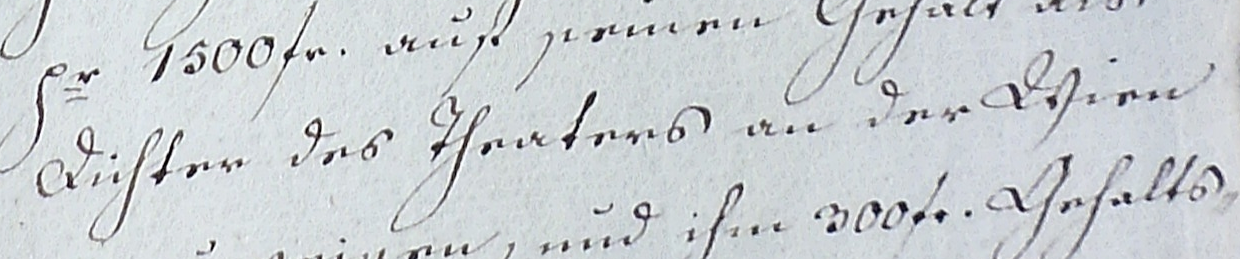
Dichter des Theaters an der Wien
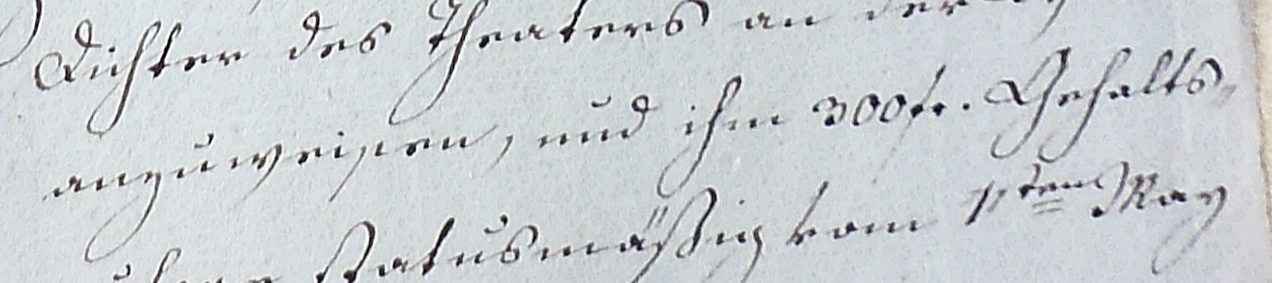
anzuweisen, und ihm 300fr. Gehalts¬
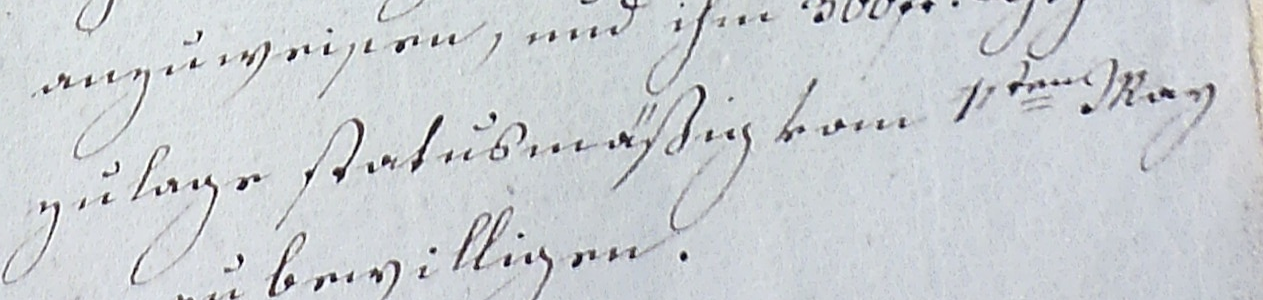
zulage statusmäßig vom 1ste͇n May
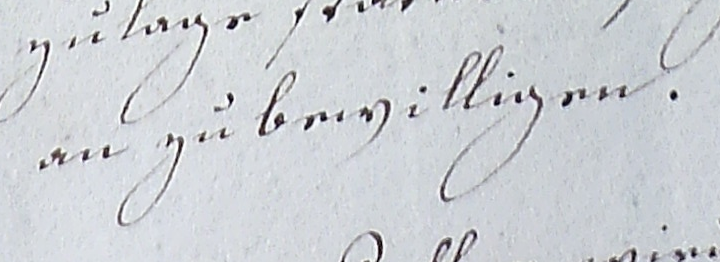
an zu bewilligen.
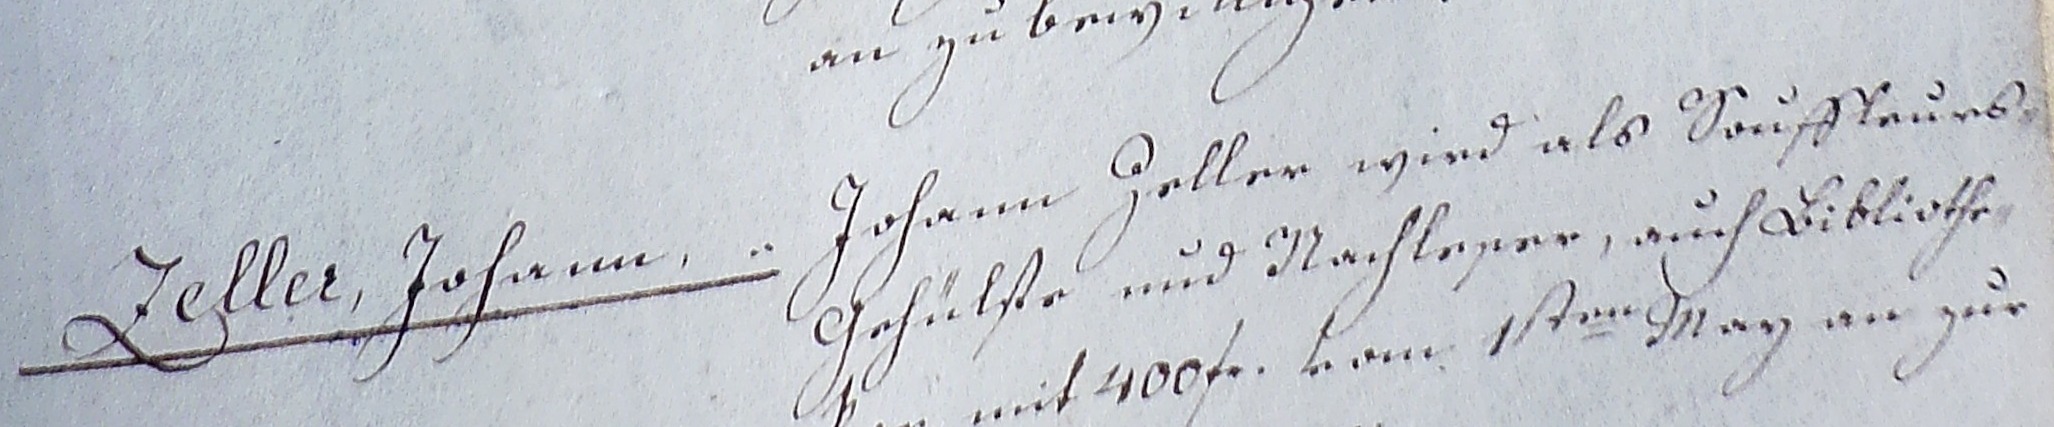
Zeller, Johann. .. Johann Zeller wird als Souffleurs¬
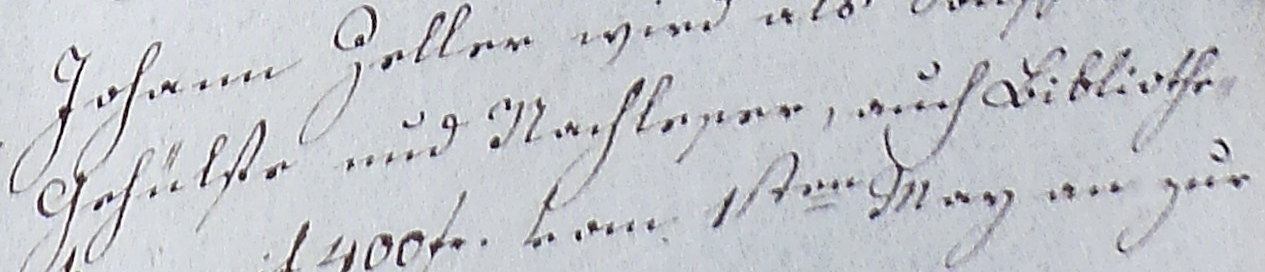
Gehülfe und Nachleser, auch Bibliothe¬
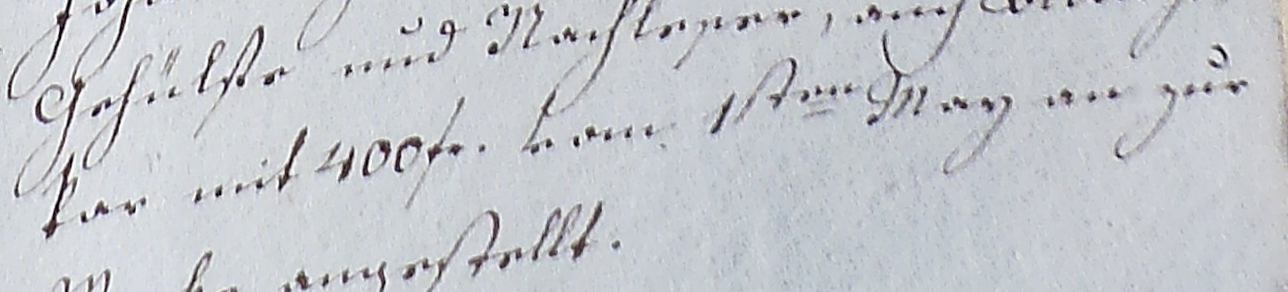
kar mit 400fr. vom 1ste͇n May an zur
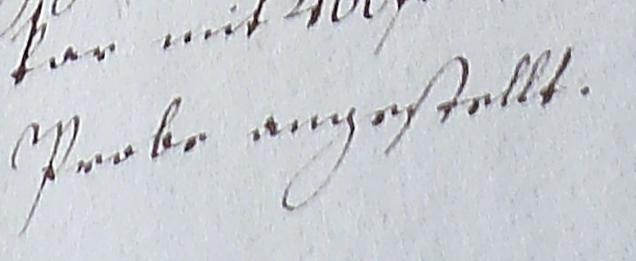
Probe angestellt.
